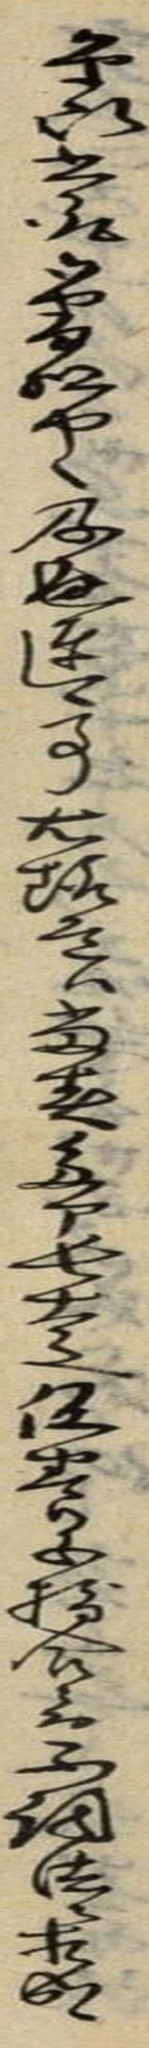筆頭書取御番組中ヘ及通達候事右趣意ハ当春多部長太夫仮養子指合ニ而不調法ニ相成候
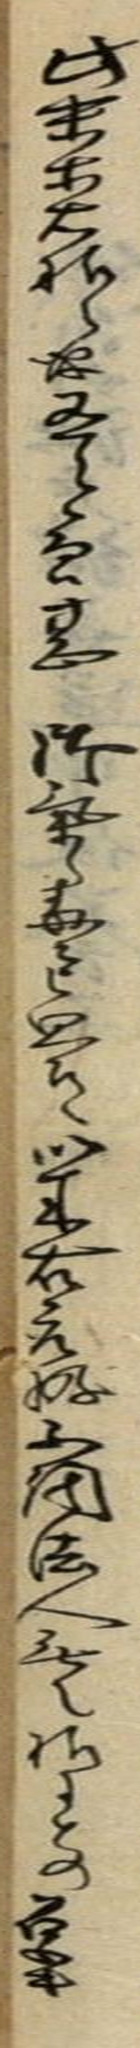此末等右様之儀有之候而ハ甚御気之毒ニ被思召候以来右取扱不調法人無之様にとの厚キ
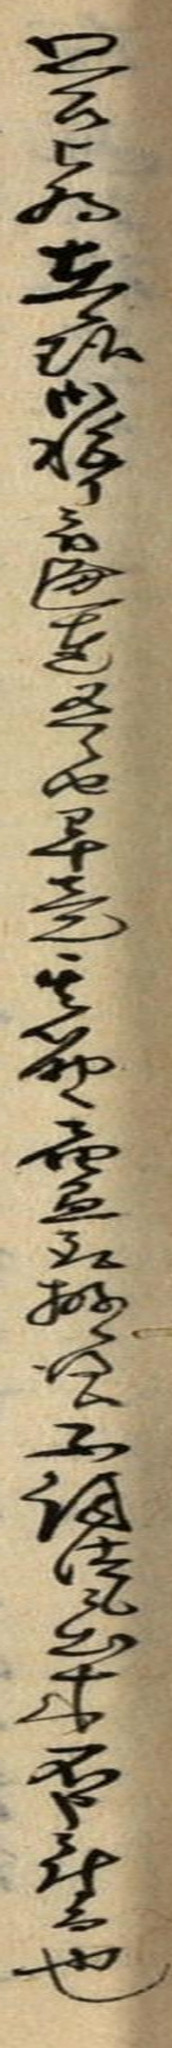思召被為在候趣御移りニ付通達有之由畢竟其筋ヘ届置取扱候得ハ不調法も出来不申ニ付而也
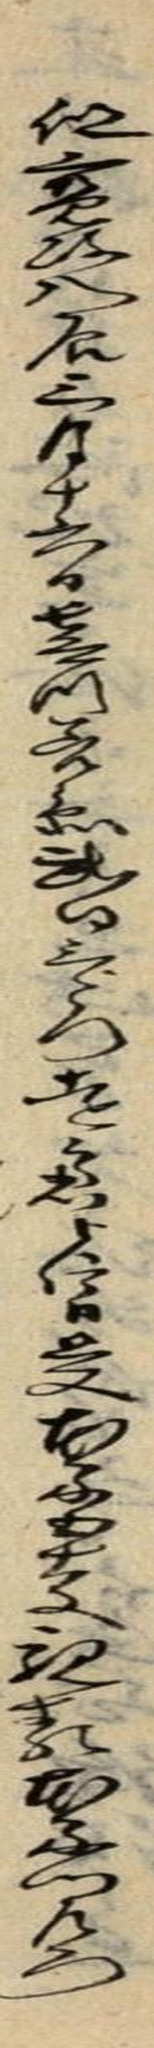但寛政八辰三月十六日長谷川善兵衛武田三郎右衛門遠慮被仰付且又本多五太夫親類本多門左衛門
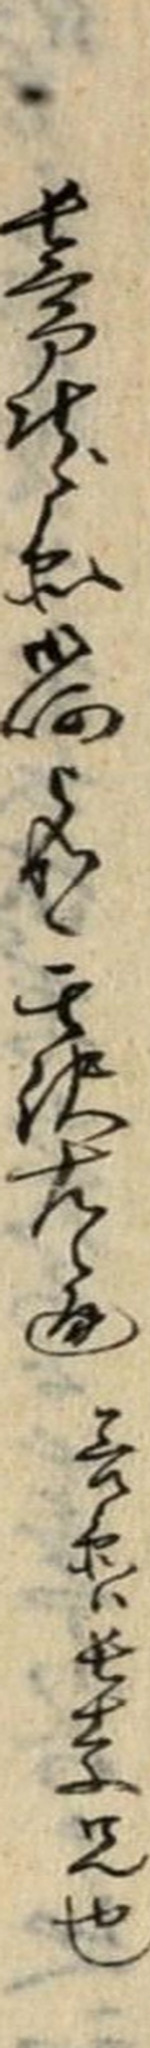長谷部次郎兵衛御呵被成候其訳左之通善兵衛ハ長太夫兄也
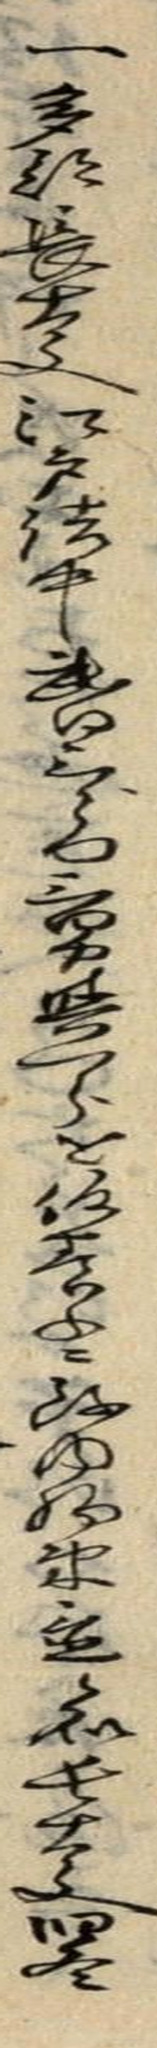一多部長太夫江戸詰中武田三郎右衛門三男與一郎を仮養子ニ致内約束置候処長太夫旧冬
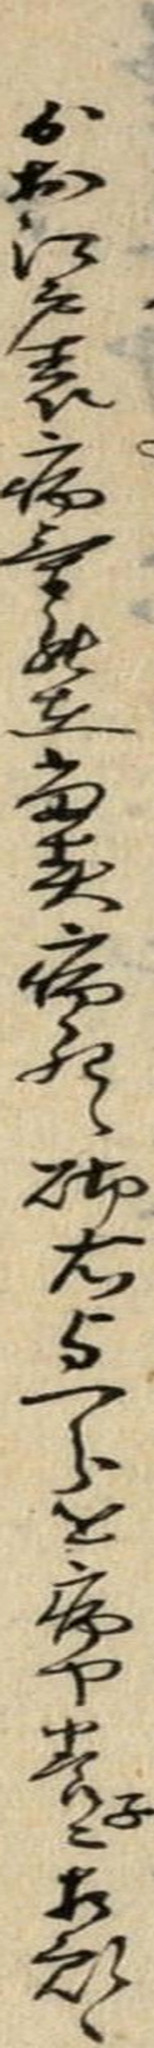ゟ於江戸表病気罷在当春病死之砌右与一郎を病中養子ニ相願候
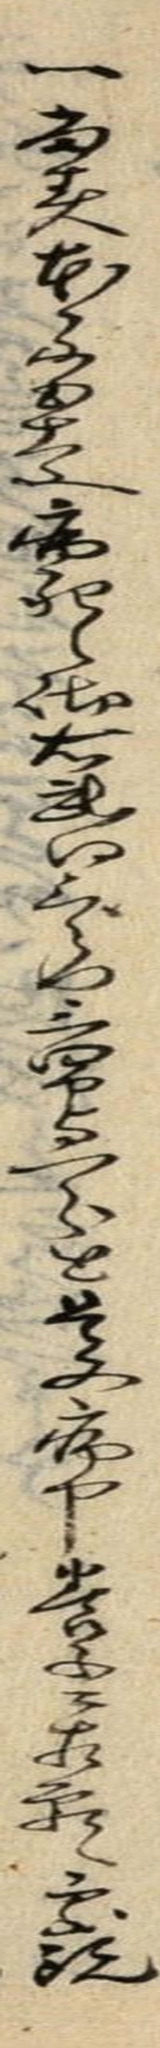一当春本多五太夫病死之砌右武田三郎右衛門三男与一郎を是又病中養子ニ相願候処既
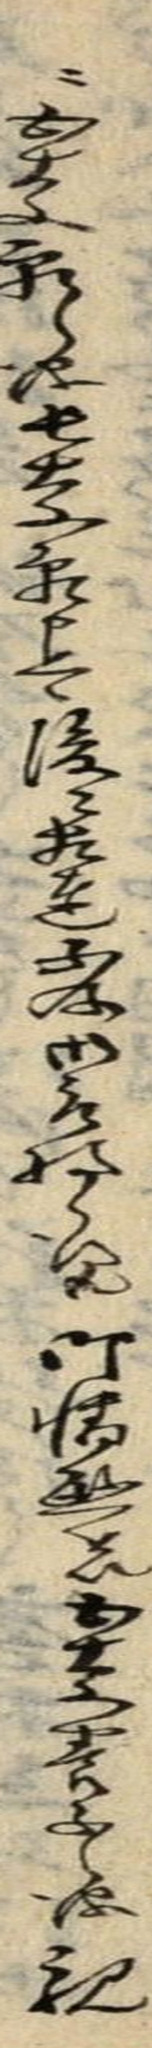ニ五太夫願之儀長太夫願申上候後ニ相達不及御取揚候得共御憐憫を以五太夫養子之儀親
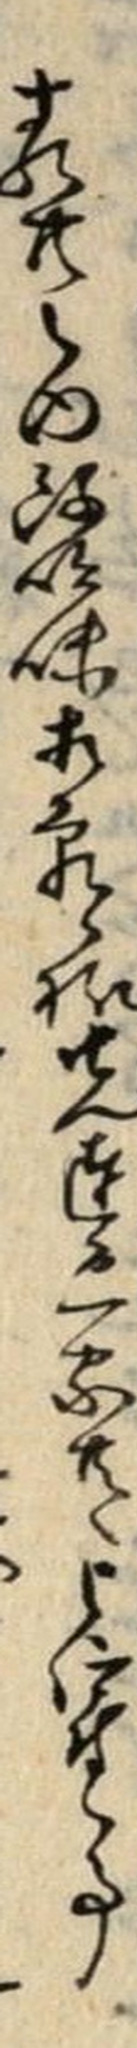類共之内致吟味相願候様先達而一家共ヘ被仰付候事
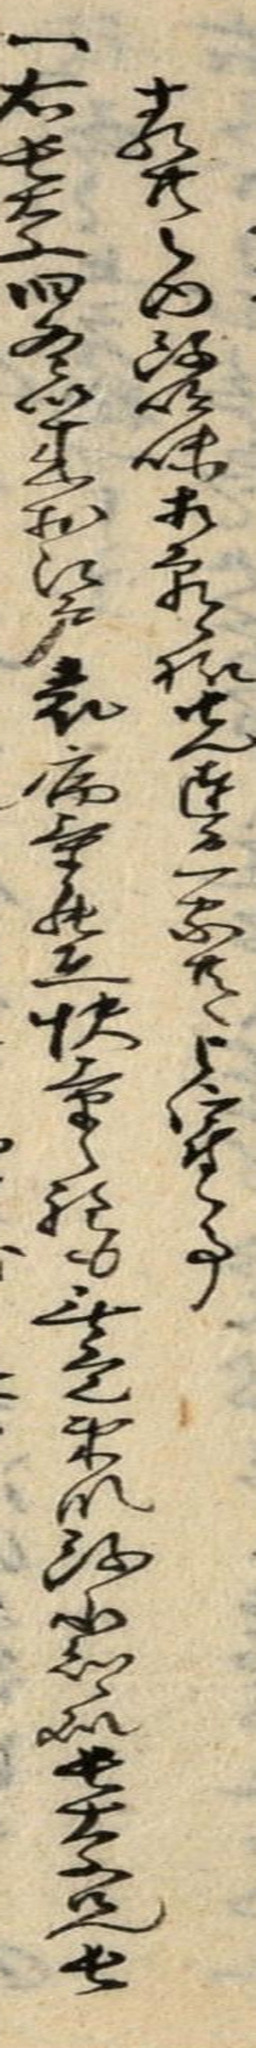一右長太夫旧冬以来於江戸表病気罷在快気之程も無覚束段致承知候処長太夫兄長
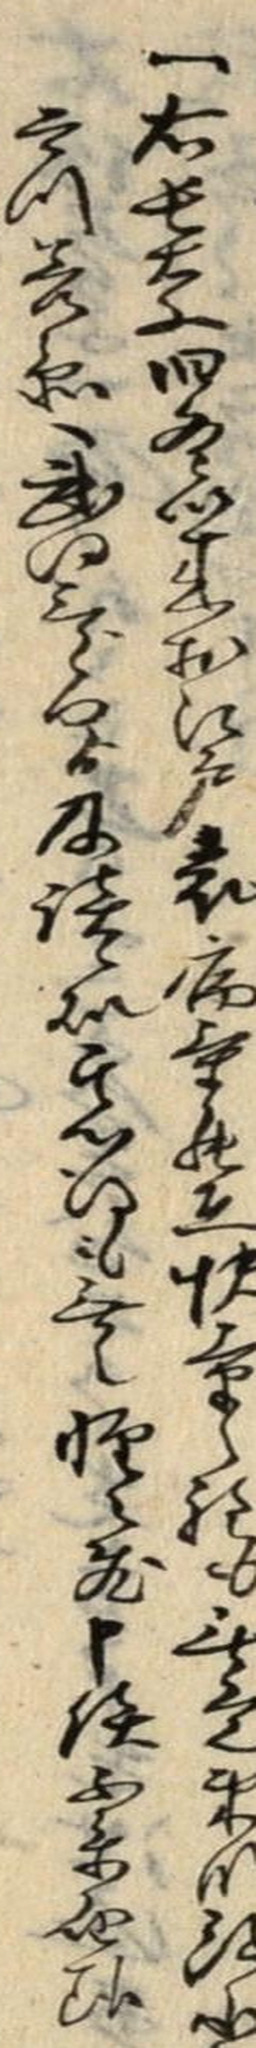谷川善兵衛ヘ武田三郎右衛門ゟ及談候処其心得も無之軽々敷申談不参届趣
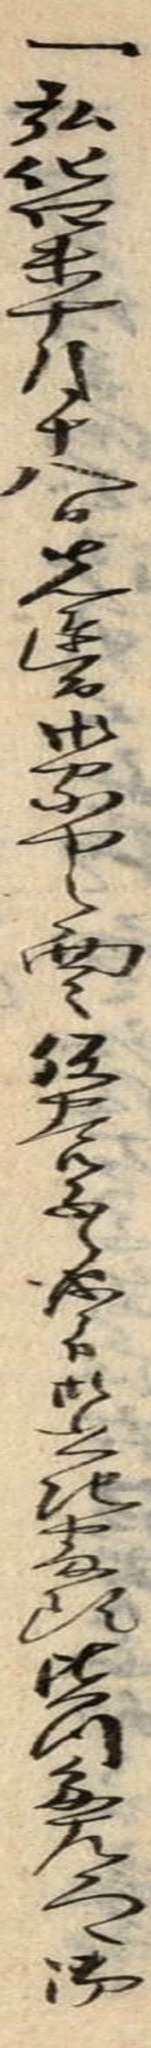一弘化四未十月十八日先達而御家中之面々仮養子之儀ニ付御書院番頭皆川多左衛門ヘ御
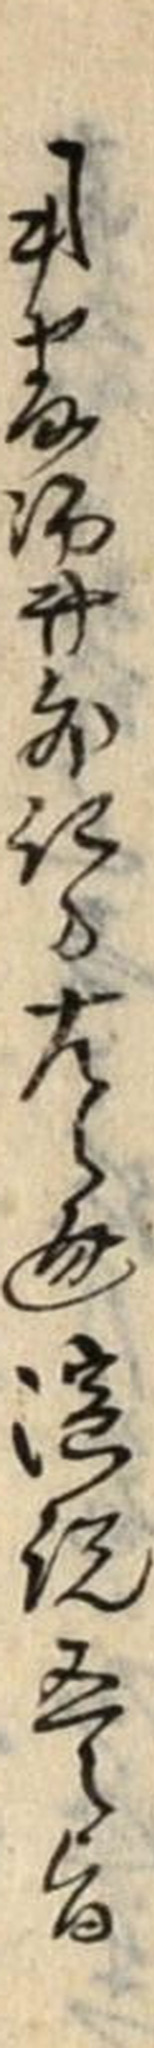用番酒井外記方左之通演説有之旨
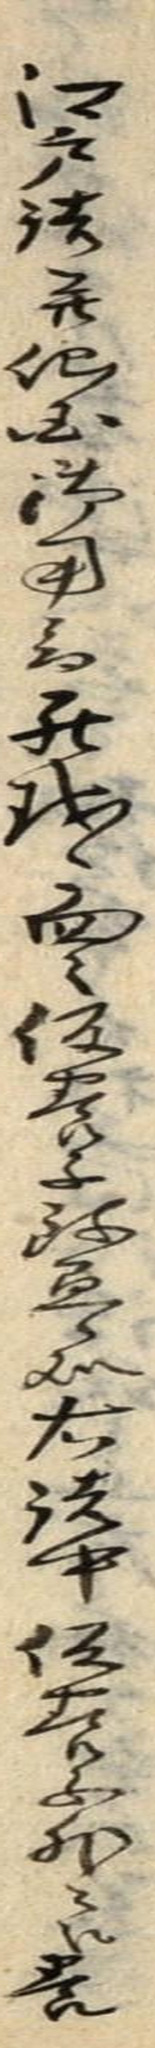江戸詰幷他国御用ニ而罷越候面々仮養子致置候処右詰中仮養子外々江養
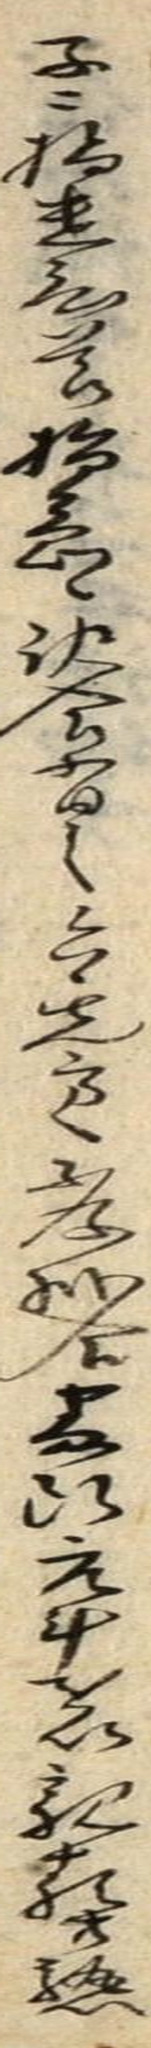子ニ指遣度節指急候訳合有之候ハゝ先方へ不及掛合番頭取斗を以親類共熟
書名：養子縁組之部
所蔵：福井県文書館 Fukui Prefectural Archives
